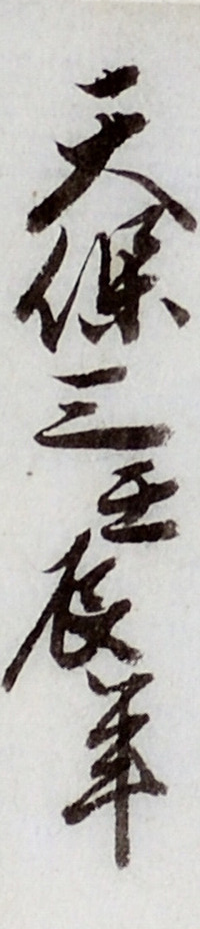天保三壬辰年
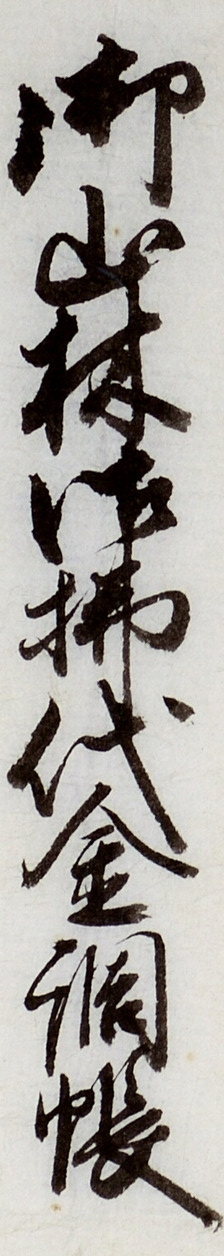御山林御払代金調帳
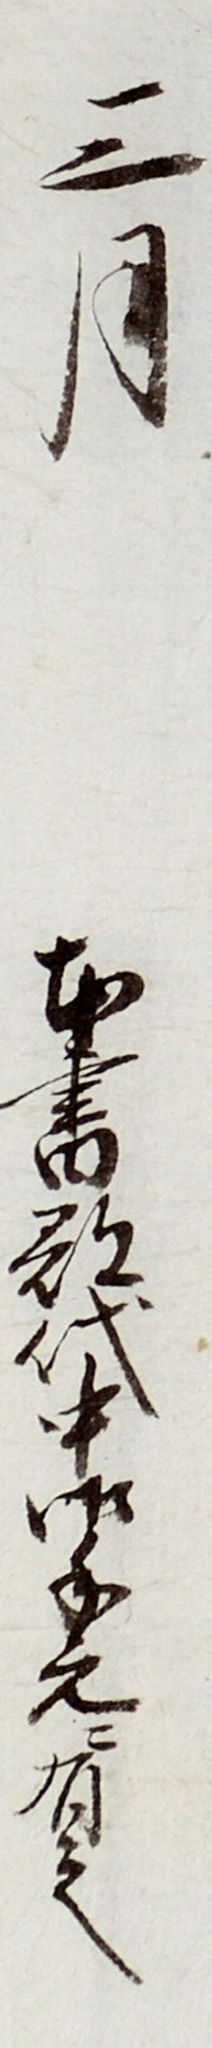三月本書郡代中御手元ニ有之
